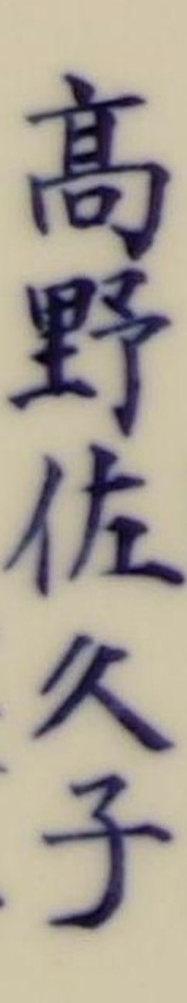高野佐久子

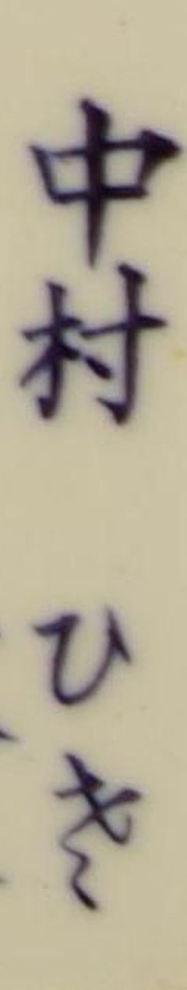中村ひき
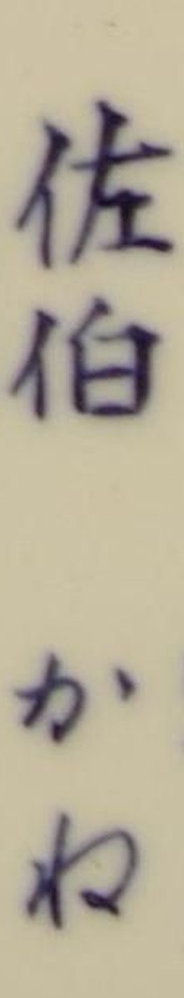佐伯かね
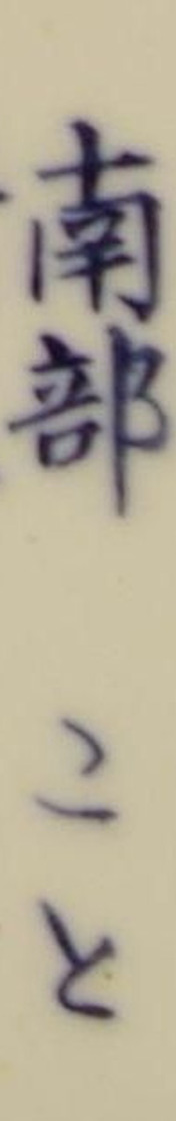南部こと
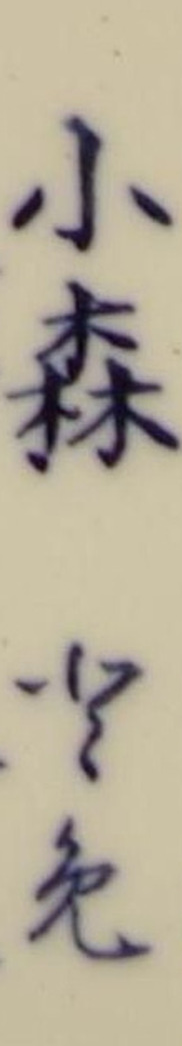小森とめ
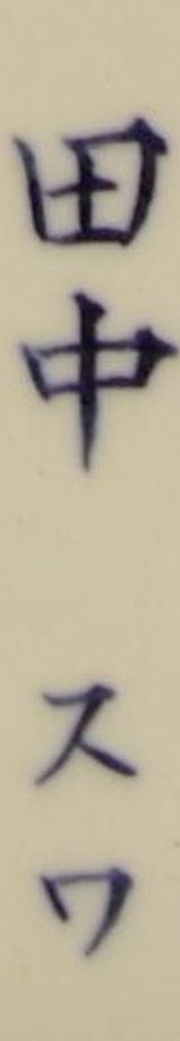田中スワ
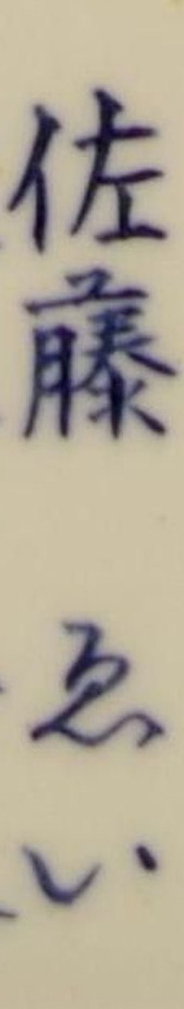佐藤えい
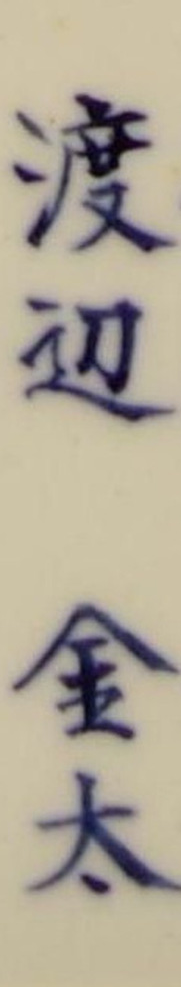渡辺金太
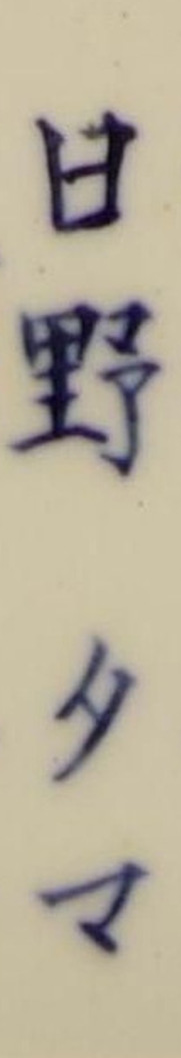日野クマ
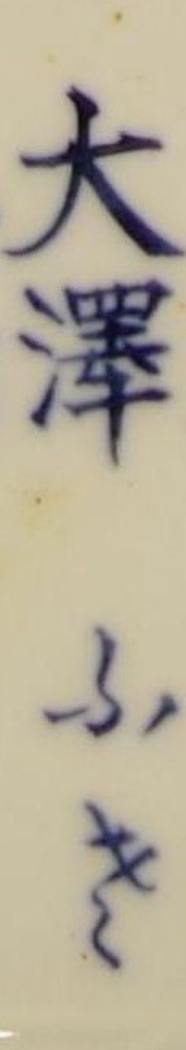大澤ふき
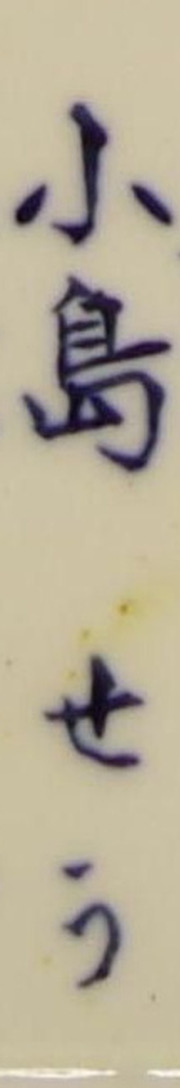小島せう
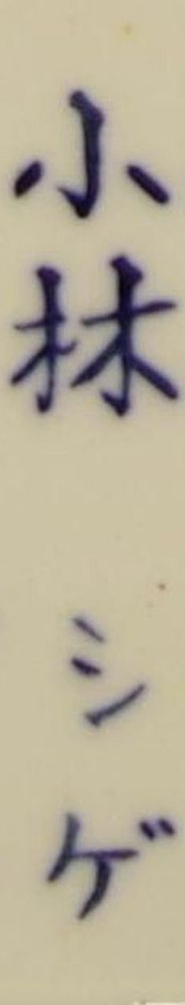小林シゲ
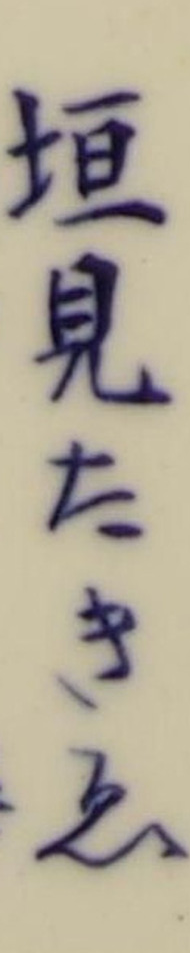垣見たきえ
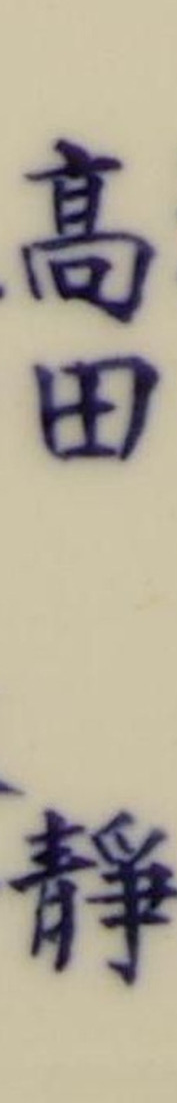高田静
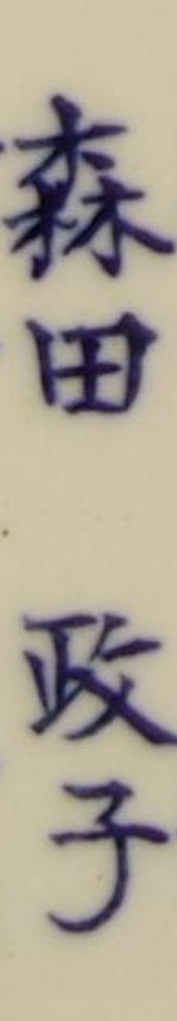森田政子
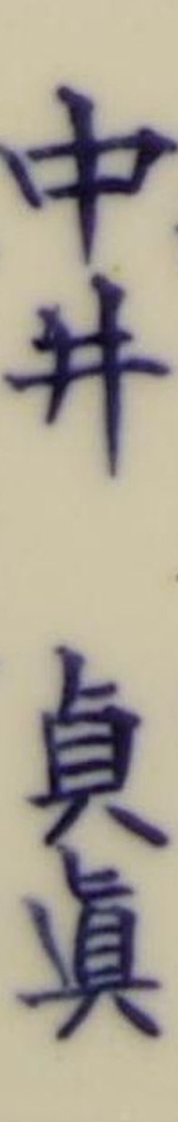中井貞真
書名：E~L
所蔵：高野山金剛峯寺
